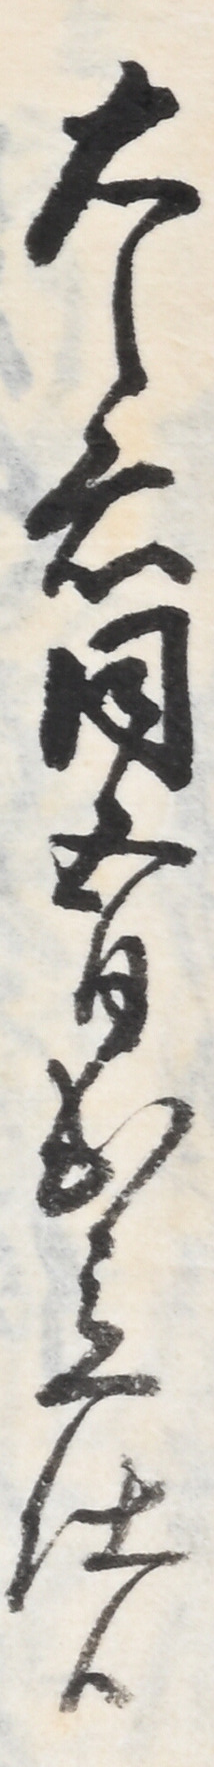右之者同九日出立仕候
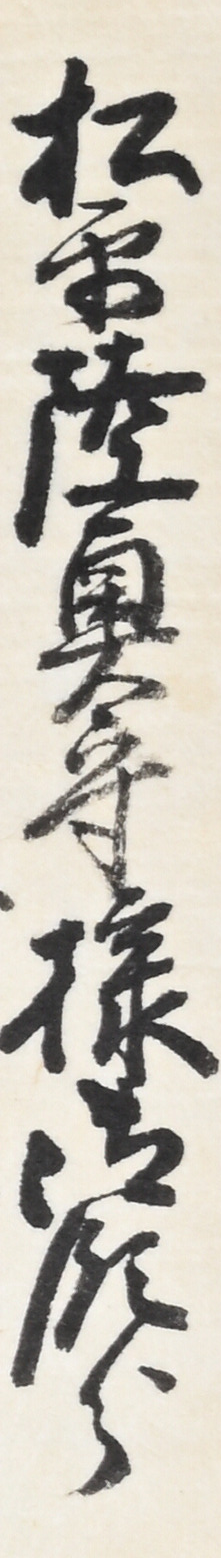松原陸奥守様御領分
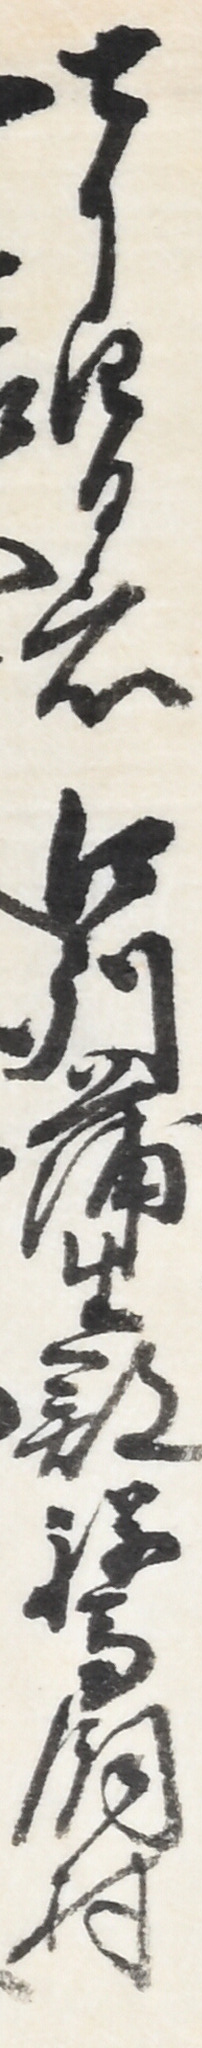七月四日着江州蒲生郡鷹飼村
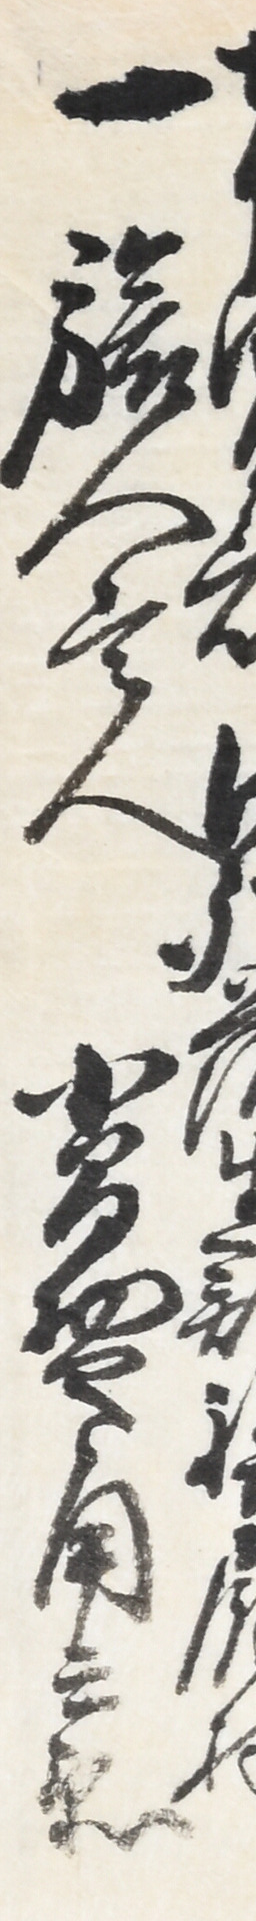一旅人壱人小間物や角兵衛
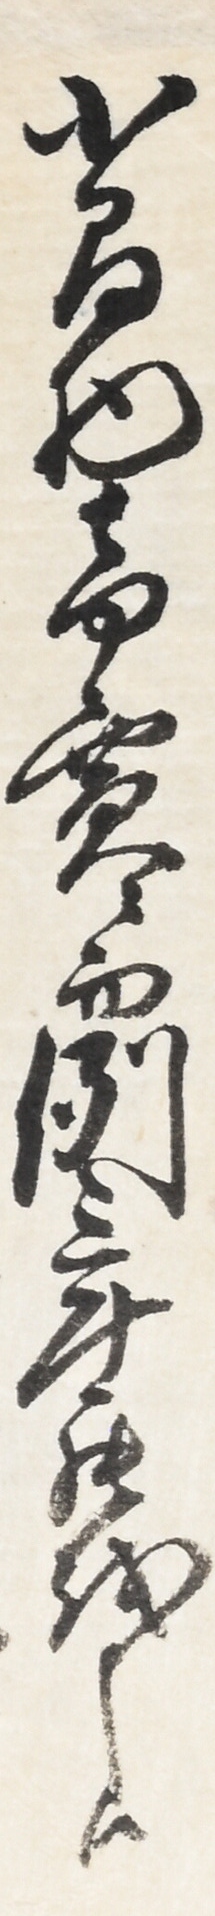小間物商売ニ而例年罷越申候
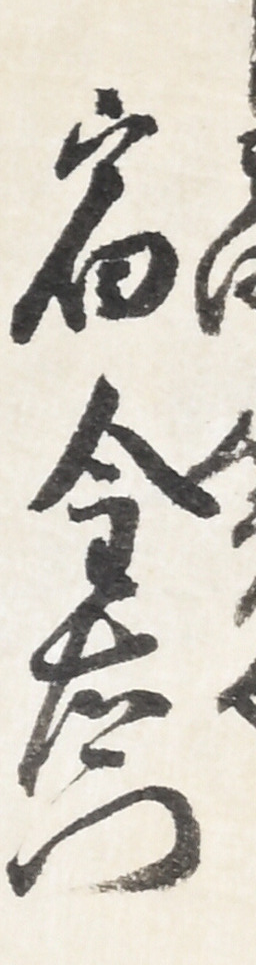宿金右衛門
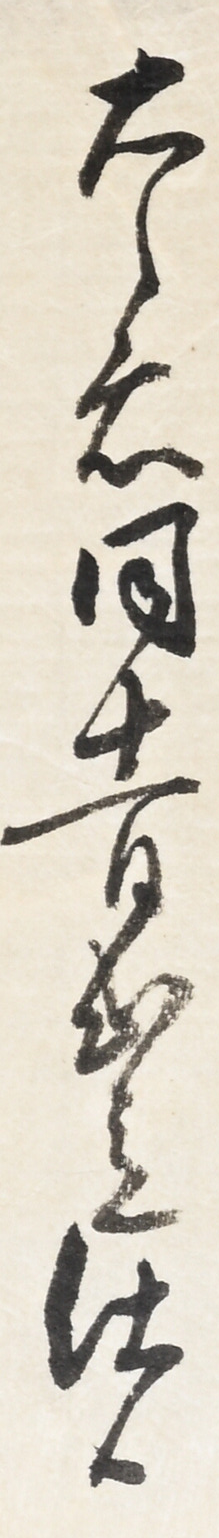右之者同十一日出立仕候
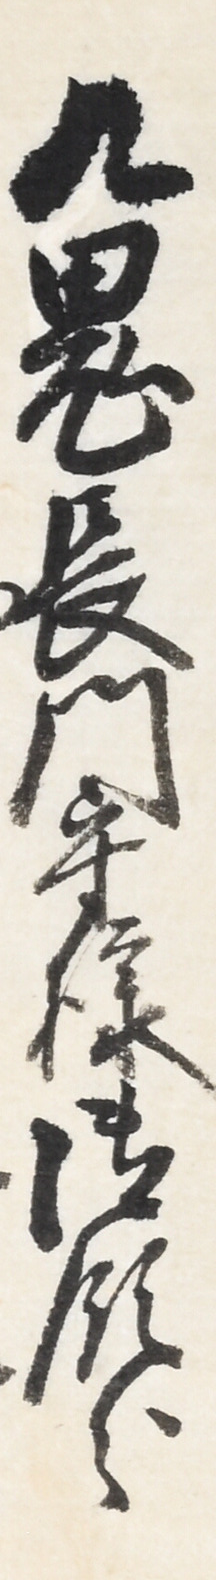九鬼長門守様御領分
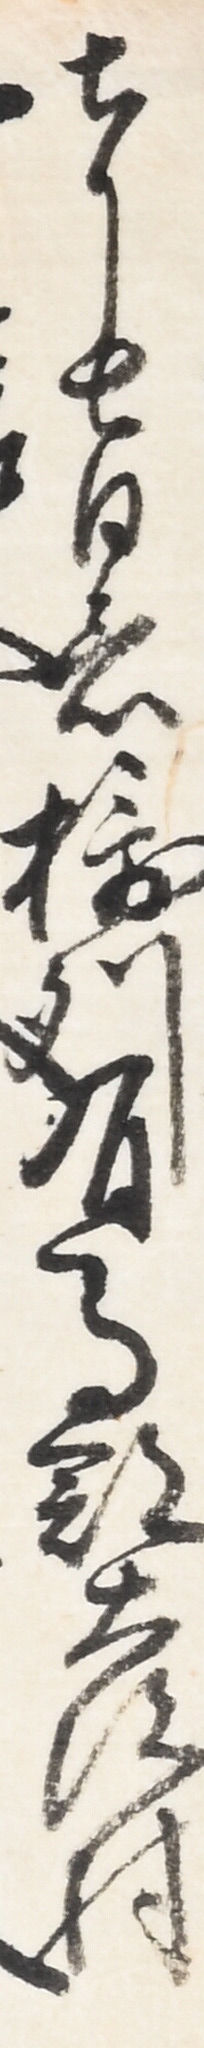七月七日着摂州有馬郡大沢村
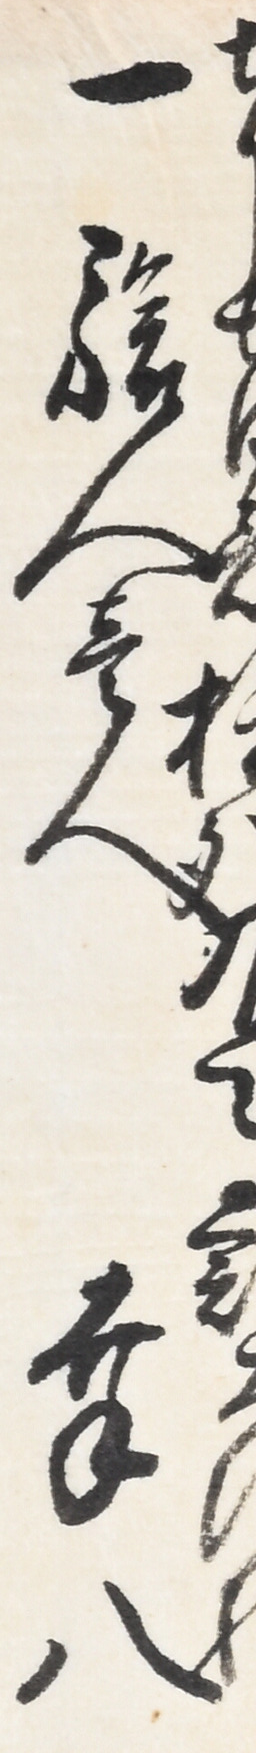一旅人壱人幸八
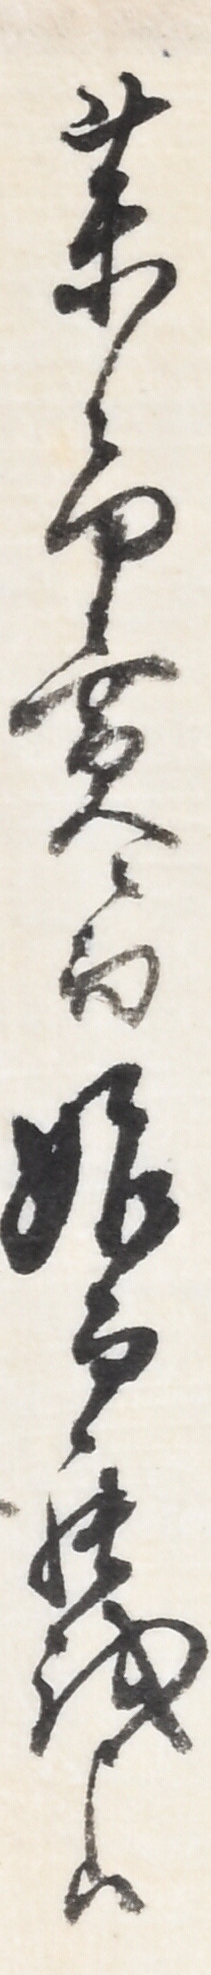薬商売ニ而始而罷越申候
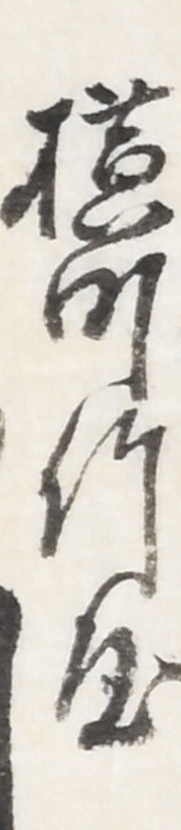横町竹屋
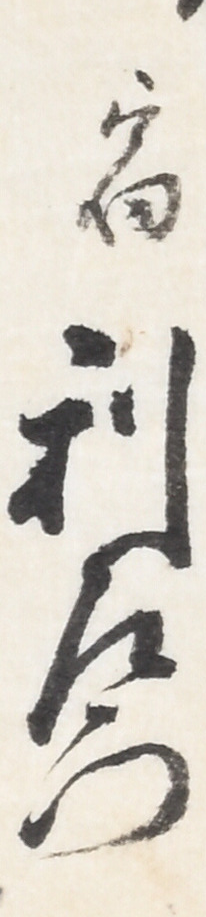宿利左衛門
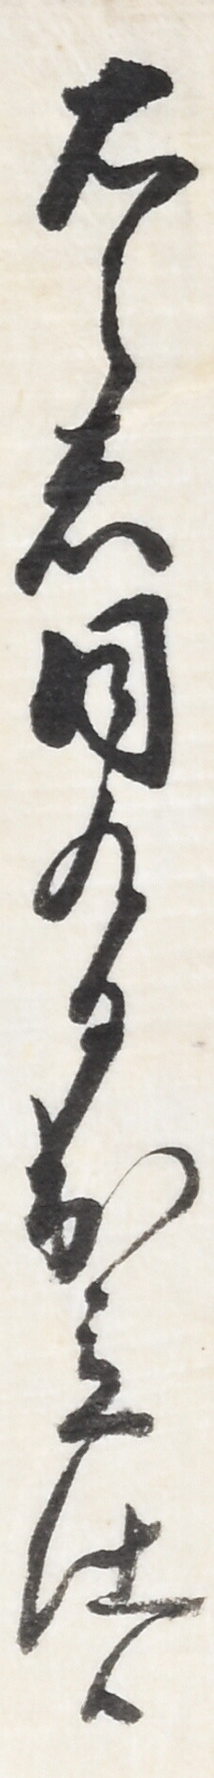右之者同九日出立仕候
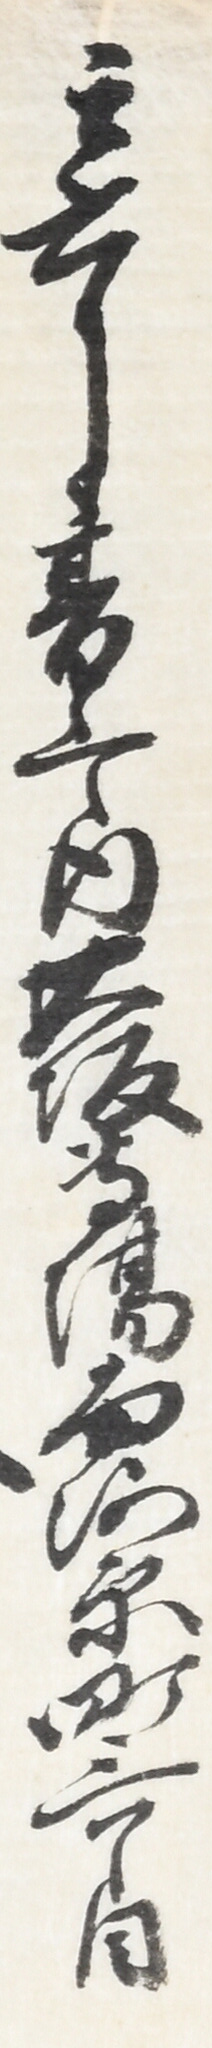壬六月書上之内大坂専場南河原町三丁目
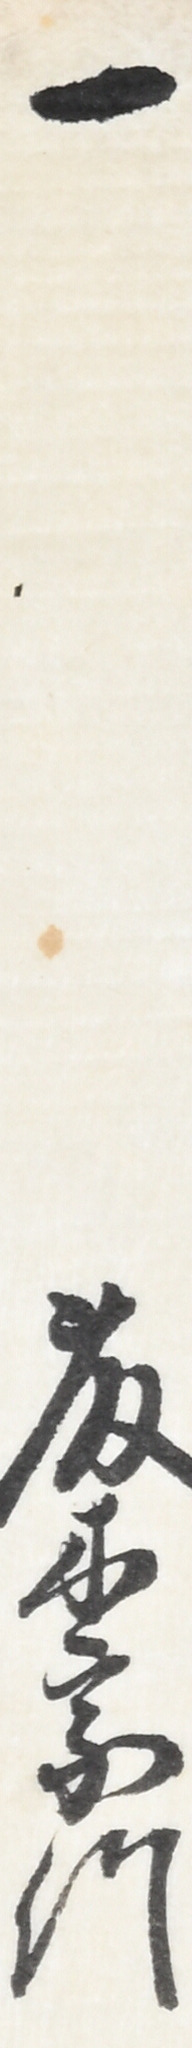一藤木家竹
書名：旅人泊控帳
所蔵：伊那市立高遠町図書館・合同会社AMANE
